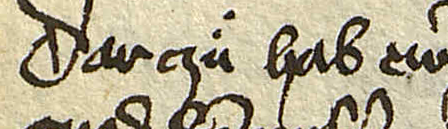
Dar cʒü hab ew*
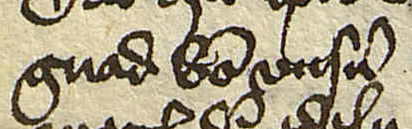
gnad vo* vnſn*
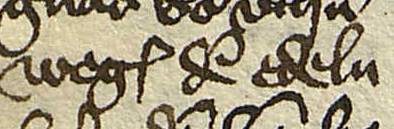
weg* d* edeln*
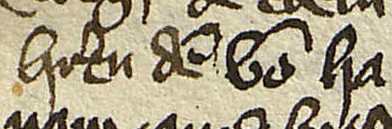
hr*en d* vo* ha
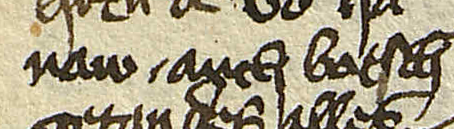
naw / auch botſch*
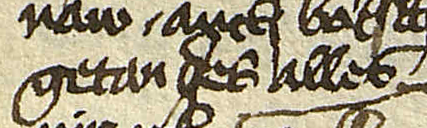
getan des alles
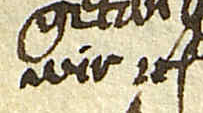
wir ec*
